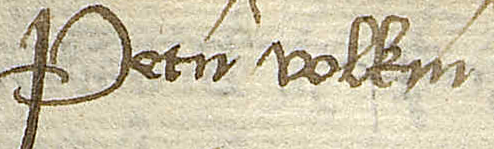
Pet*n volkm*
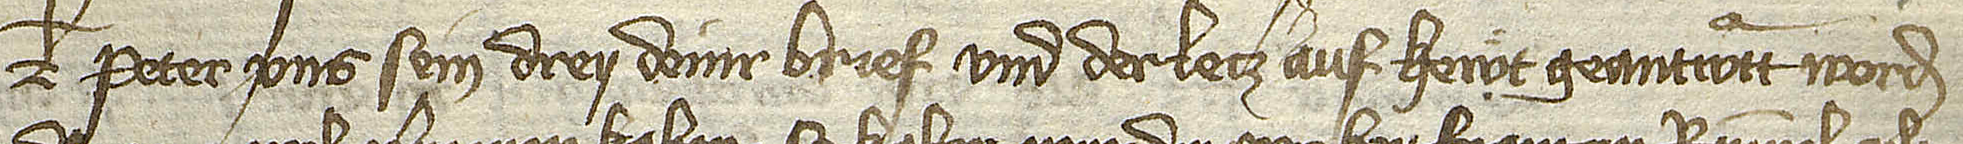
L* Peter vns ſein drey deinr brief vnd der lecʒ* auf hewt geantw*tt word*
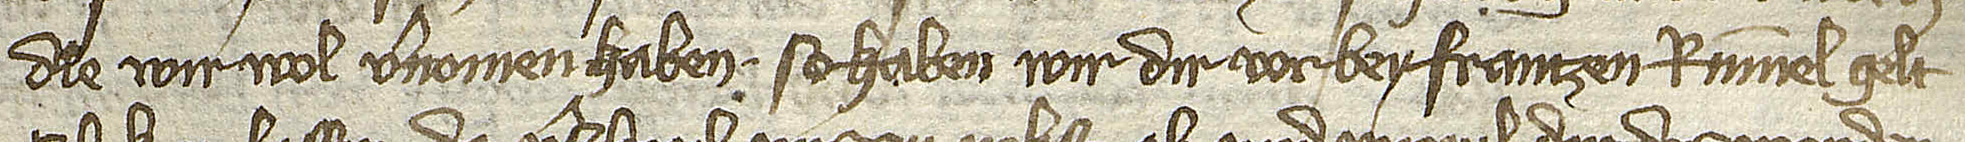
die wir wol v*nomen haben . ſo haben wir dir vor bey francʒen Rum*el gelt
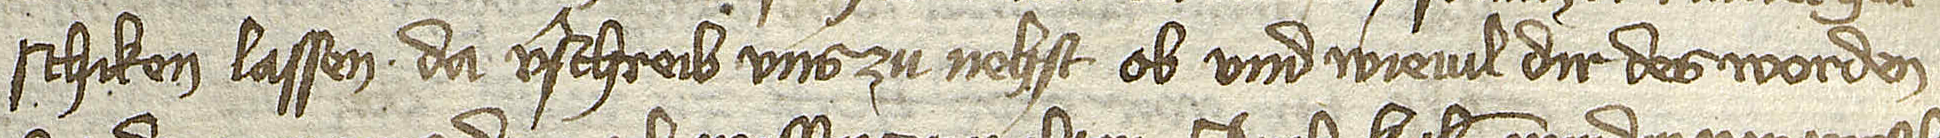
ſchiken laſſen . da v*ſchreib vns ʒu nehſt ob vnd wieuil dir des worden
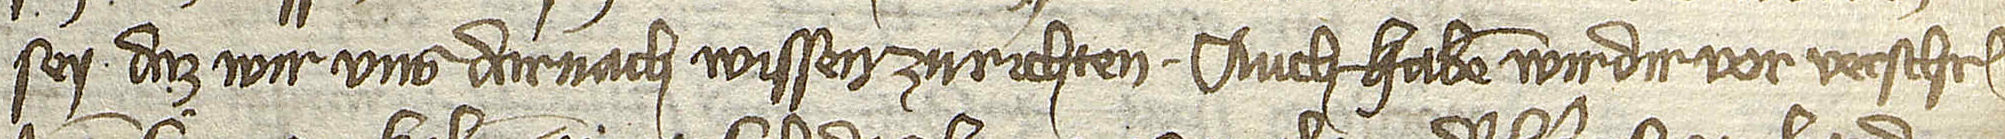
ſey . daʒ wir vns darnach wiſſen ʒurichten . Auch habe* wir dir vor verſchr*
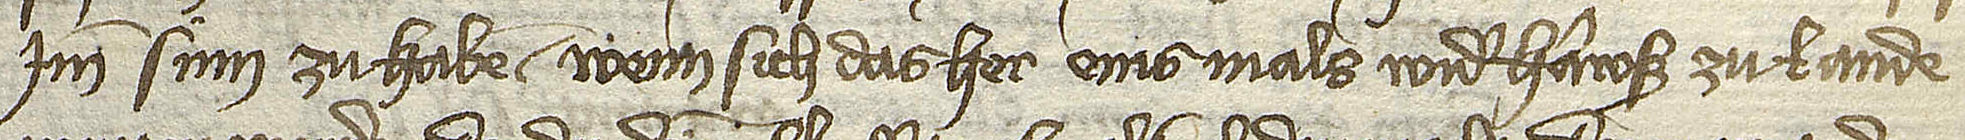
Im* ſinn ʒu habe* / wenn ſich das her eins mals wid* h*awſʒ ʒu lande
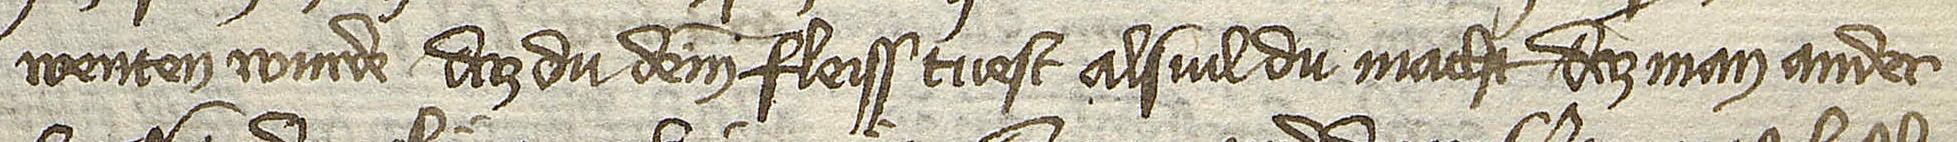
wenten wurde / daʒ du dein* fleiſſ tueſt alſuil du macht / daʒ man ander
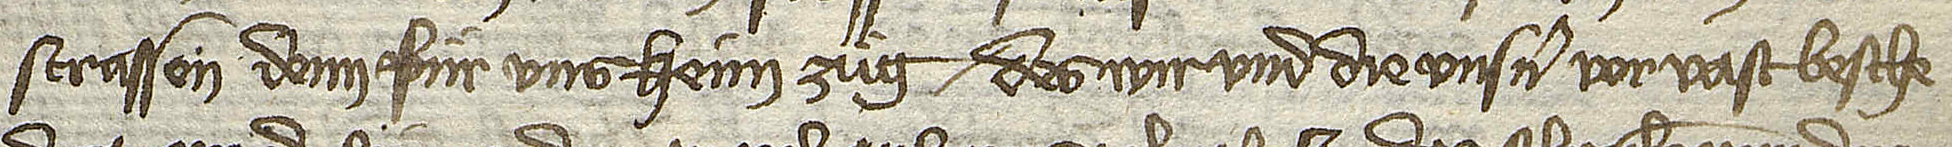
ſtraſſen denn für vns heim ʒüg / des wir vnd die vnſ*n vor vaſt beſche
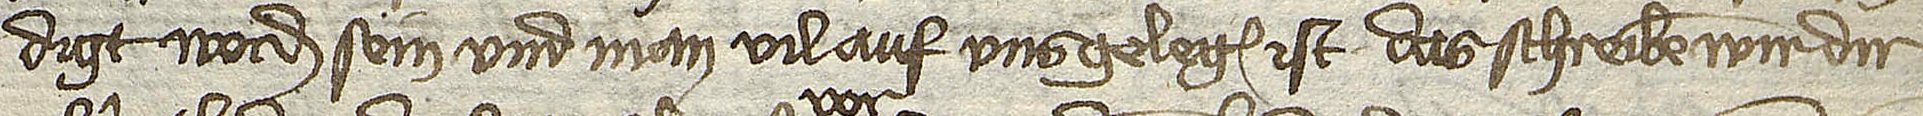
digt word* ſein vnd man vil auf vns geleg* iſt . das ſchreibe* wir dir
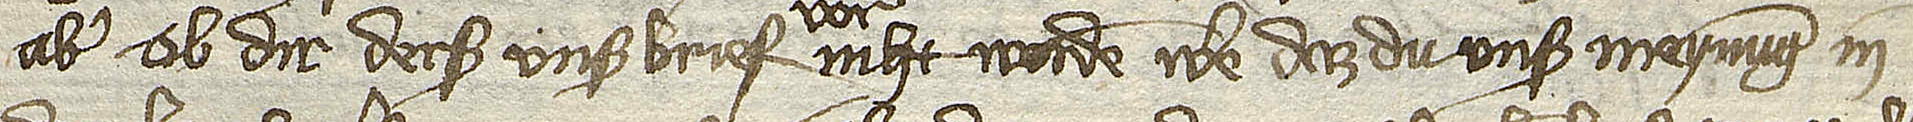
ab* / ob dir derſ* vnſ* brief niht worde* we* daʒ du vnſ* meynug* in
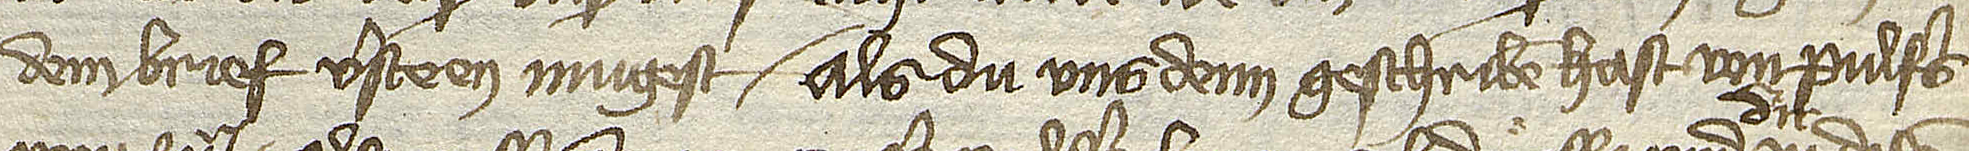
dem brief v*ſteen mugeſt / als du vns denn geſchribe* haſt von Pulf*s
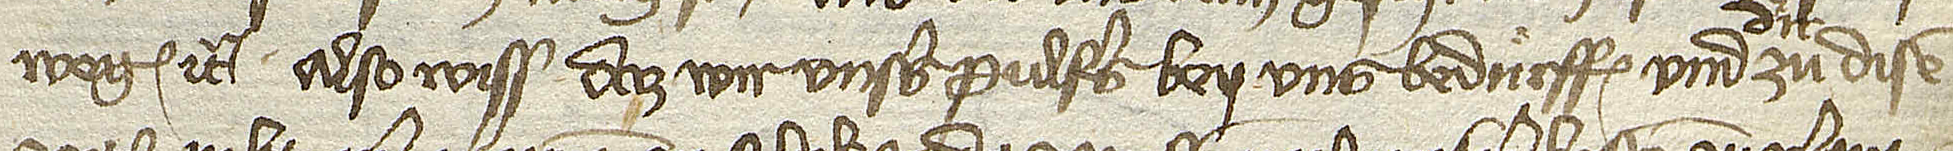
weg* ec* alſo wiſſ daʒ wir vnſ*s Pulf*s bey vns bedürff* vnd ʒu diſe*
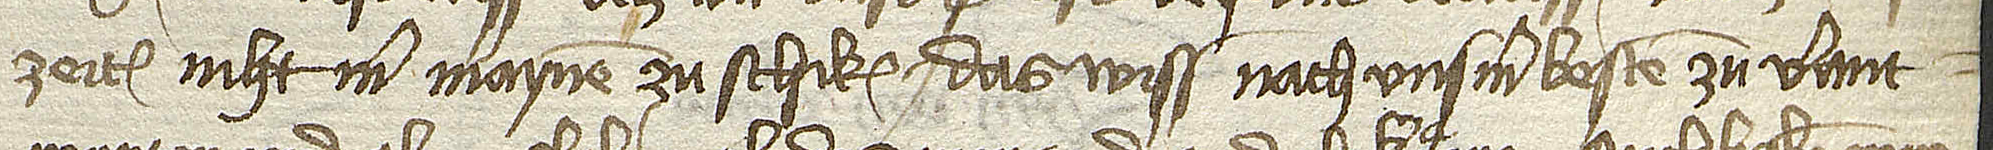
ʒeit* niht m* mayne* ʒu ſchik* / das wiſſ nach vnſ*m beſte* ʒu v*ant =
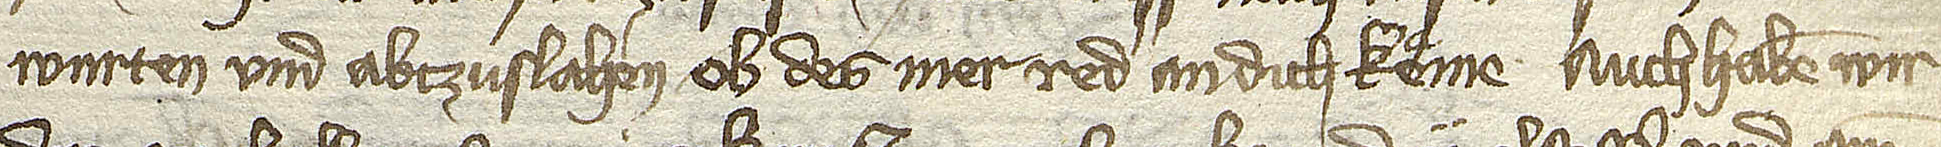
wurten vnd abcʒuſlahen / ob des mer red an dich këme auch habe* wir
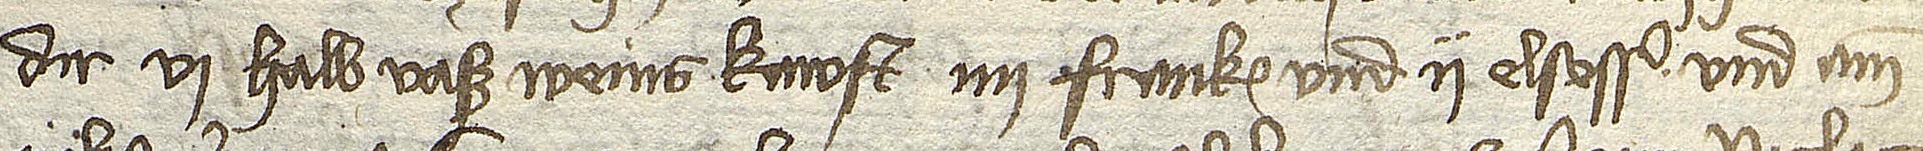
dir vi halb vaſʒ weins kawft iiii frank* vnd ii elſeſſ* vnd am*
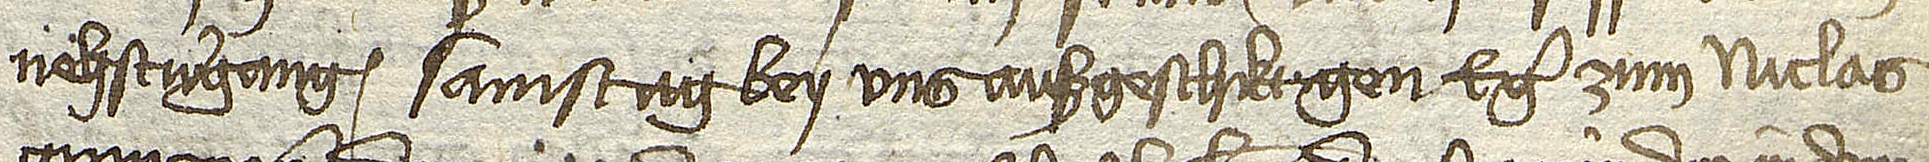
nehſtu*gang* ſamſtag bey vns auſʒgeſchikt gen Eg* ʒum Niclas
